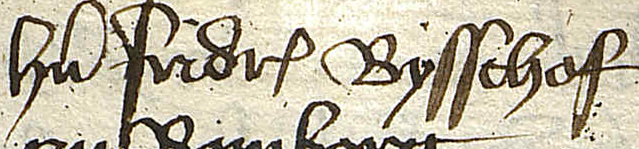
H*n Fridr* Byſſchof
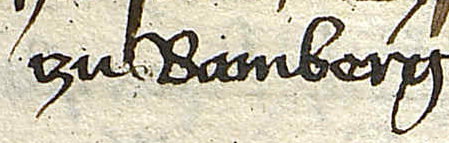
cʒu Bamberg
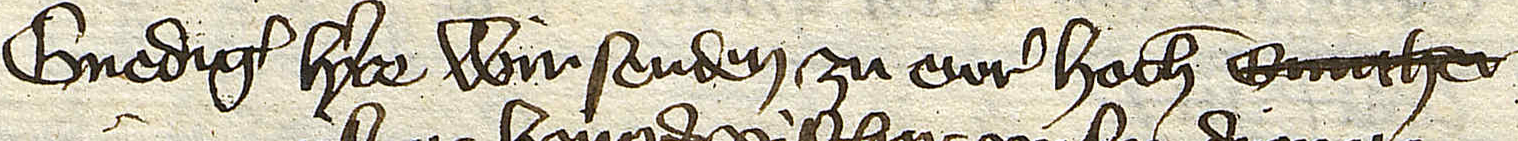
Gnedig* h*re Wir ſenden cʒu ew*r hoch Gunther
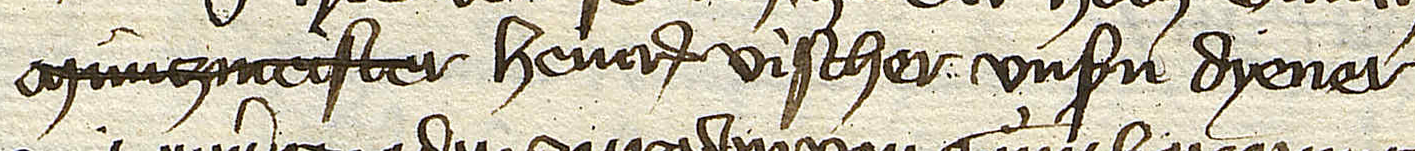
Müncʒmeiſter heinr* viſcher vnſ*n dyener
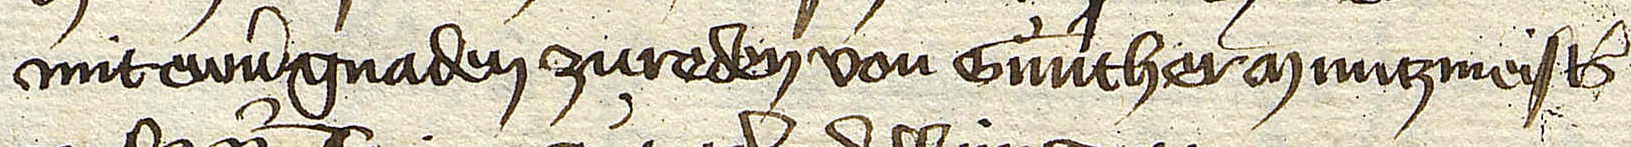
mit ew*n gnaden ʒureden von Günther Muncʒmeiſt*s
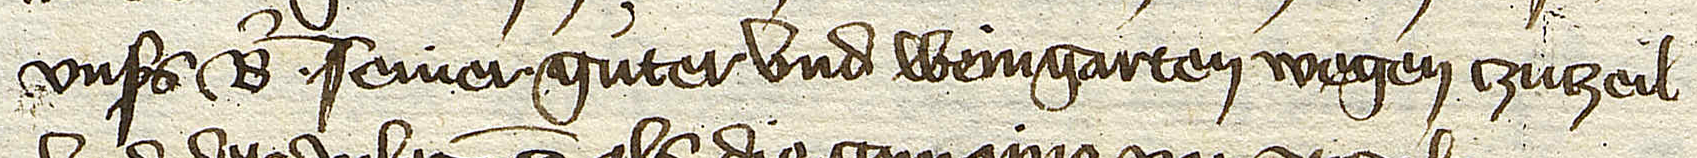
vnſ*s B* . ſeiner güter vnd Weingarten wegen cʒucʒeil
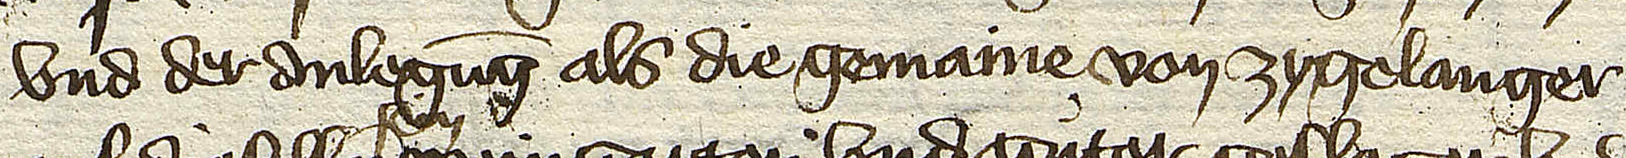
vnd der Anlegu*g als die gemaine von ʒygelanger
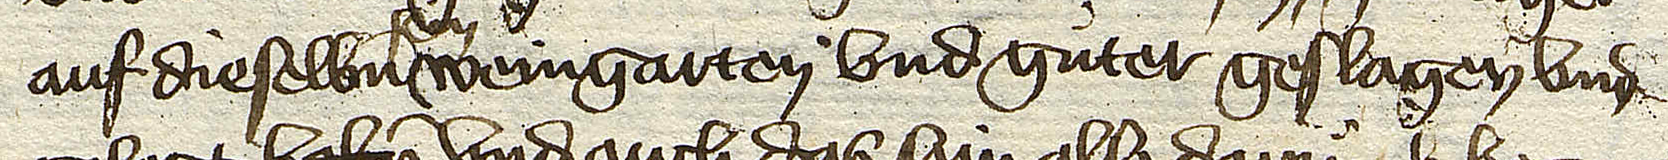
auf dieſelb*n weingarten . vnd güter geſlagen vnd
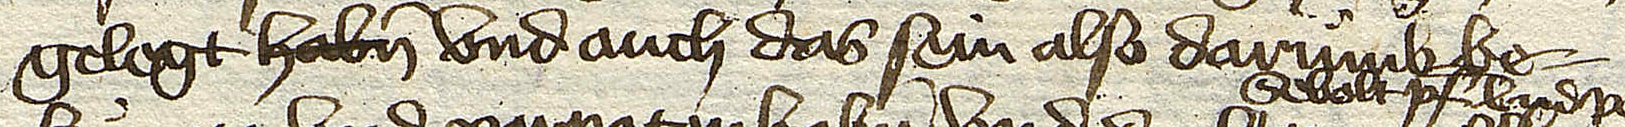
gelegt hab*n vnd auch das ſein alſo darümb be =
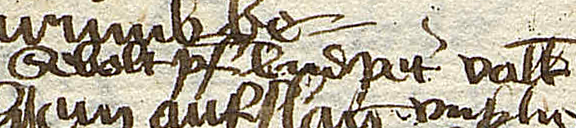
Sebolt pf* vnd pet* volk*
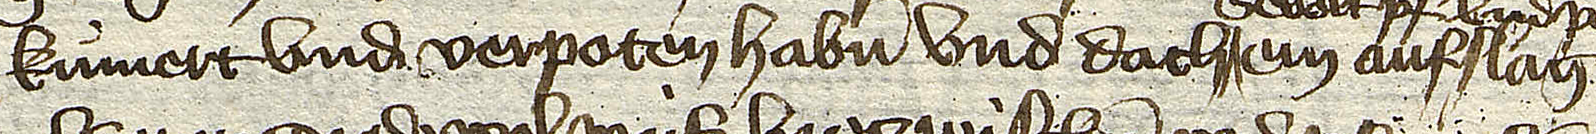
kümert vnd verpoten hab*n vnd doch ein aufflag
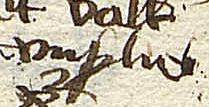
vnſ lieb
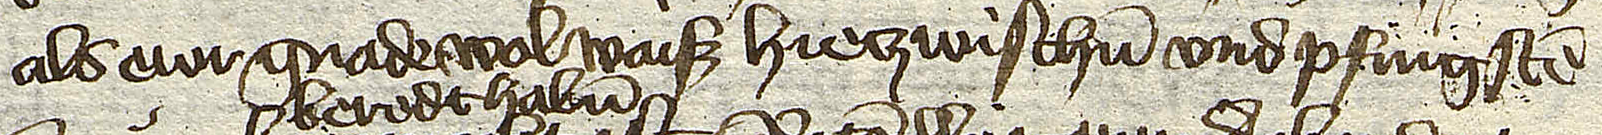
als ewr gnade wol waiſʒ hiecʒwiſch*n vnd pfingſte*
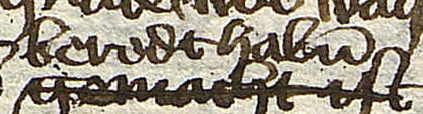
beredt hab*n
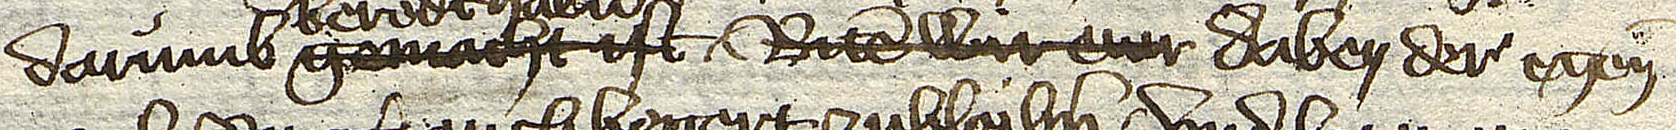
darümb gemacht iſt / Bite* wir ewr dabey der egen*
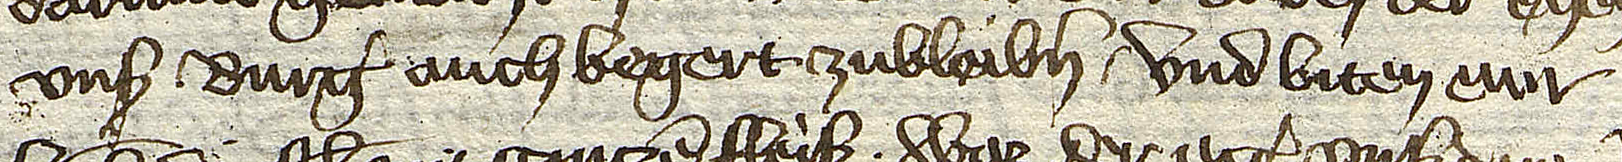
vnſ* Burg* auch begert cʒubleib*n / Vnd biten ewr
